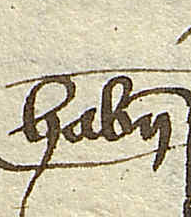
habn*
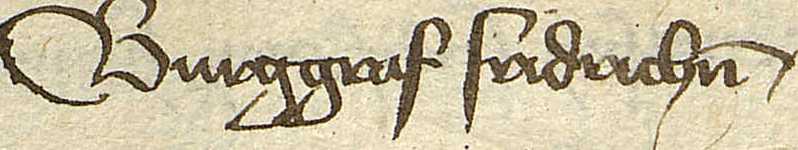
Burggraf Fridrichn* /
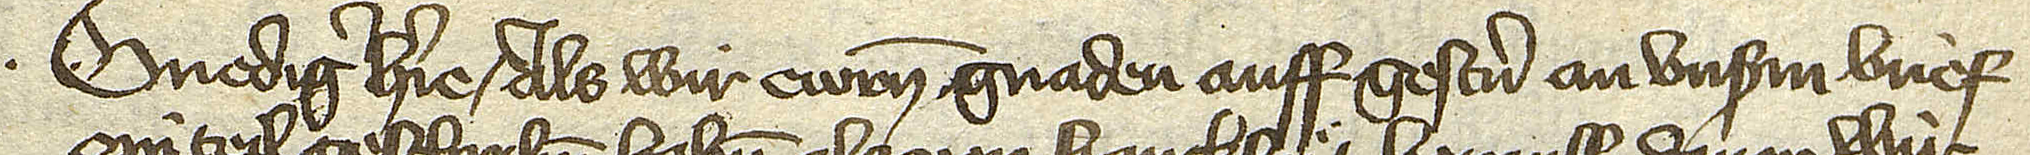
Gnedig* h*re / Als wir ewrn* gnaden auff geſtn* an vnſ*m brief
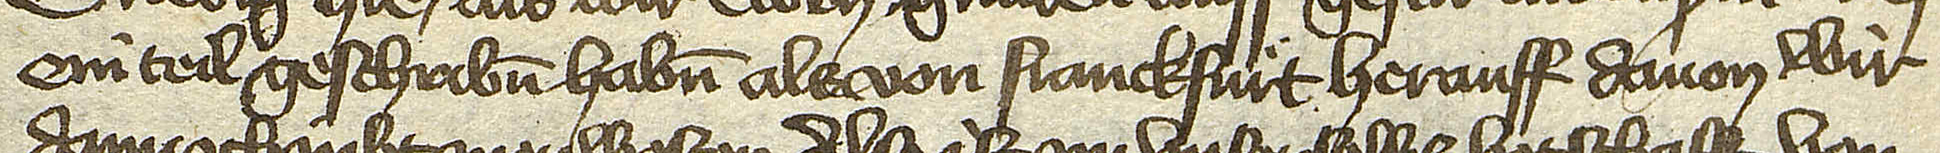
ein teil geſchribn* habn* als von franckfürt herauff dauon wir
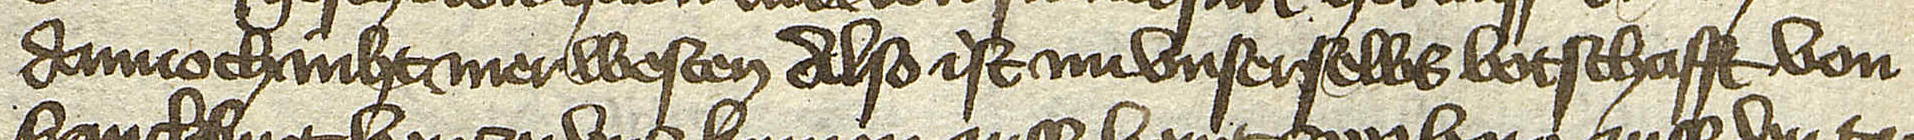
dannoch niht mer weſten Alſo iſt nu vnſerſelbs botſchafft von
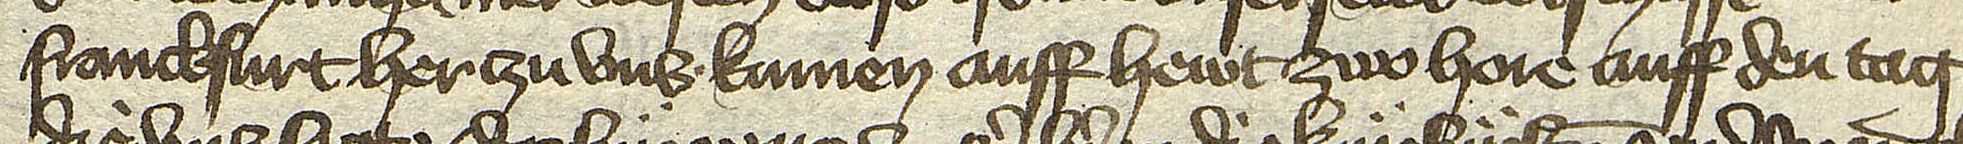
franckfurt her cʒu vns kumen auff hewt cʒwo hore auff den tag
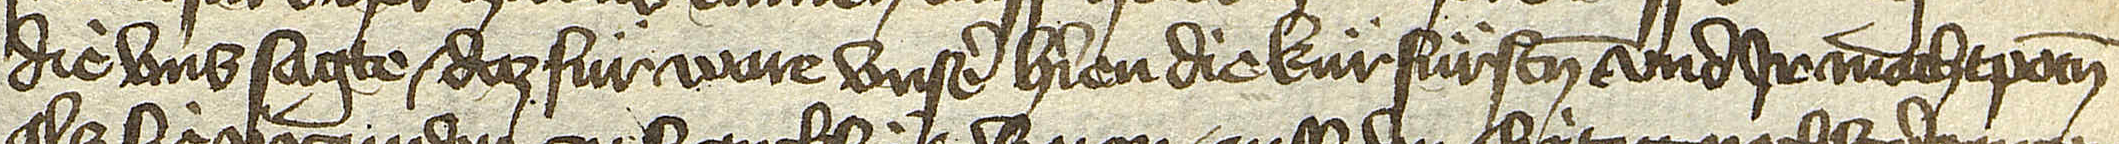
die vns ſagte / daʒ für ware vnſs* hr*en die kürfürſtn* vnd Ir machtpotn*
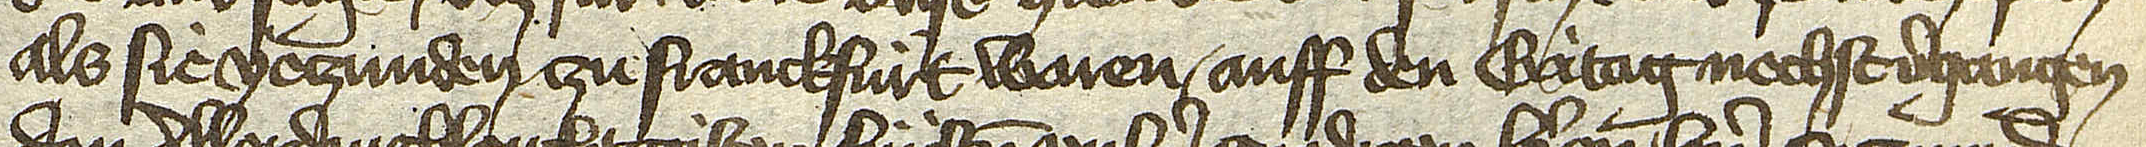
als ſie yecʒunden cʒu franckfürt waren / auff den Eritag nechſt v*gangen
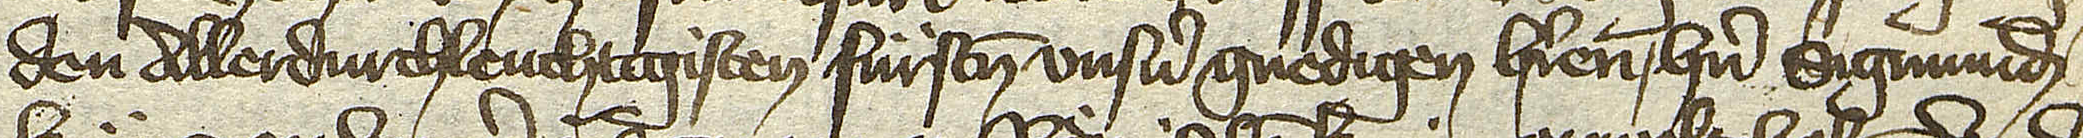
den Allerdurchleuchtigſten fürſtn* vnſn* gnedigen hr*en / hn* Sigmund*
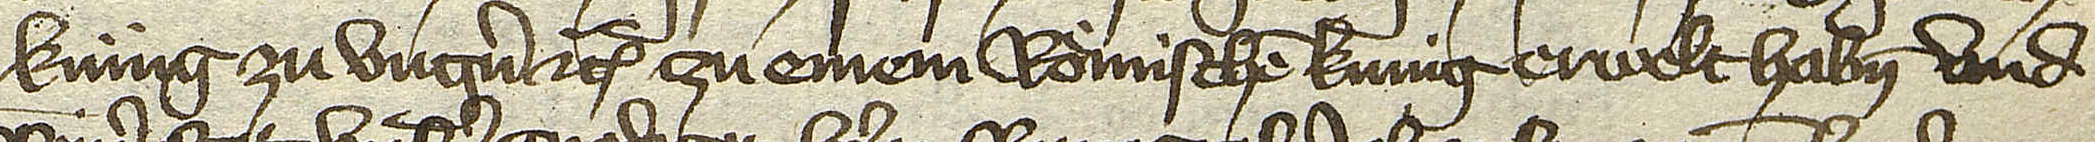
künig cʒu vngn* ec* cʒu einem Römiſche* kunig erwelt habn* vnd
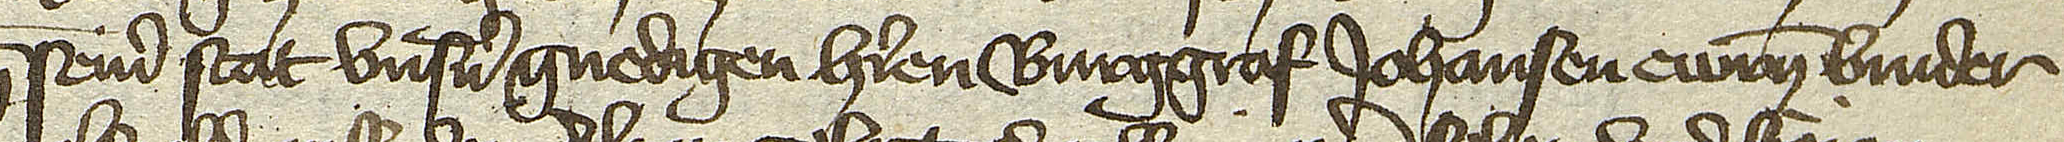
ſein* ſtat vnſn* gnedigen hr*en Burggraf Iohanſen ewrn* bruder
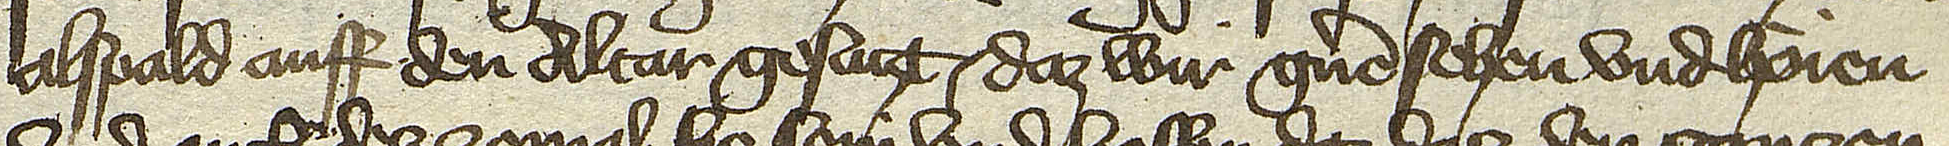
alſpald auff den Altar geſacʒt / daʒ wir gne* ſehen vnd hören
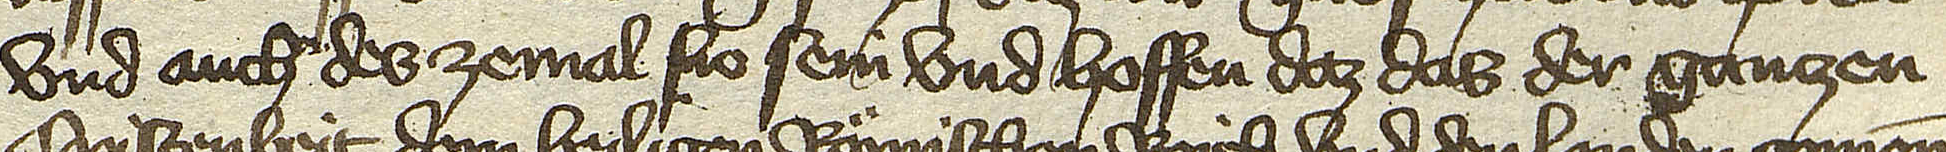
vnd auch des cʒemal fro ſein vnd hoffen daʒ das der gancʒen
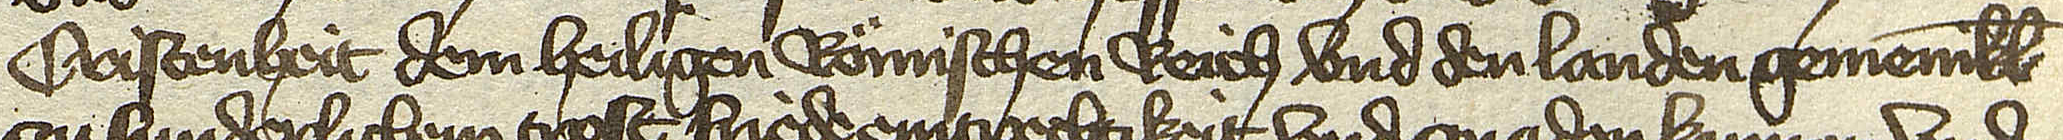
Criſtenheit dem heiligen Römiſchen Reich vnd den landen gemeinikl*
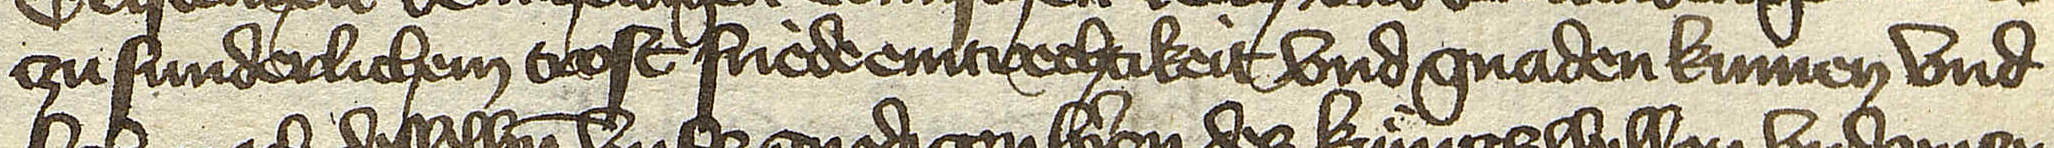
cʒu ſunderlichen troſt fride eintrechtikeit vnd gnaden kumen vnd
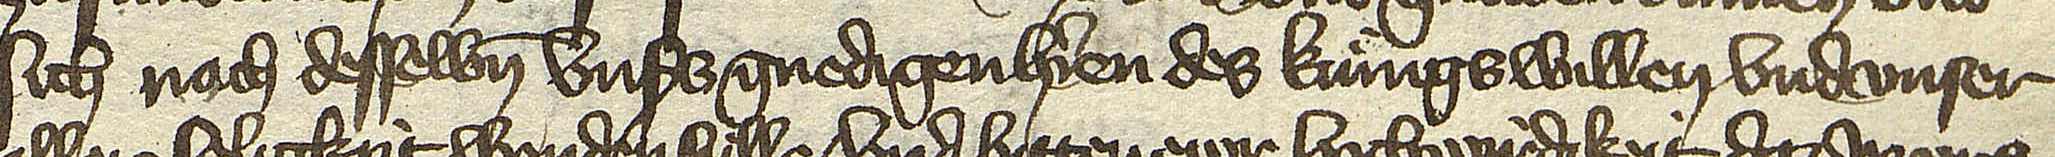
ſich nach deſſelbn* vnſ*s gnedigen hr*en des künigs willen vnd vnſer
